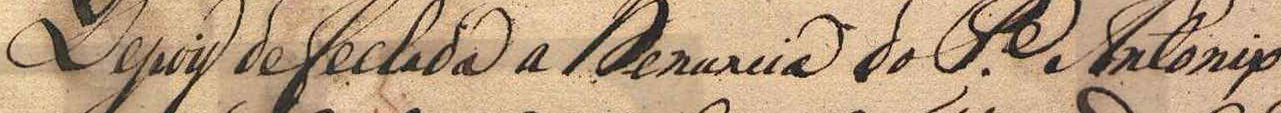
Depois de fechada a Denuncia do P.e Antonio
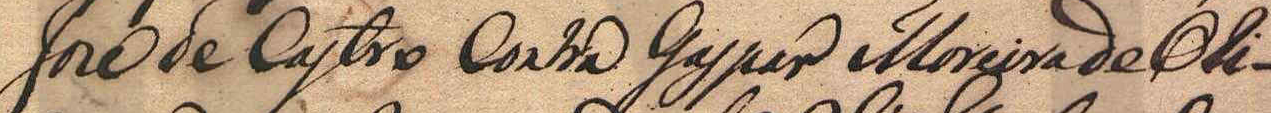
Joze de Castro Contra Gaspar Moreira de Oli
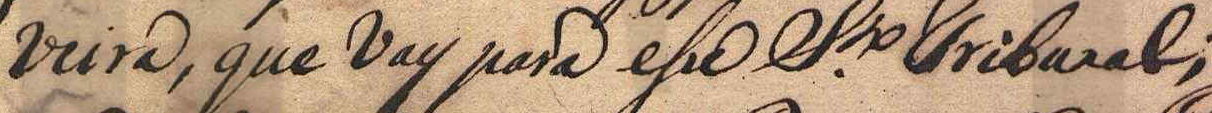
veira, que vay para esse S.to Tribunal;
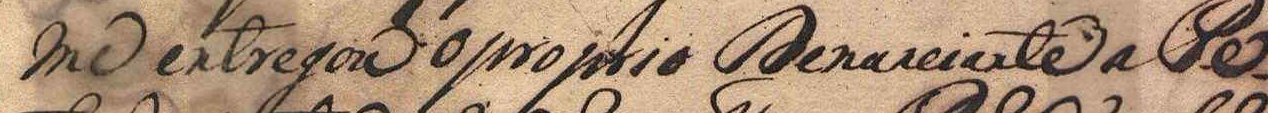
me entregou o proprio Denunciante a Pe
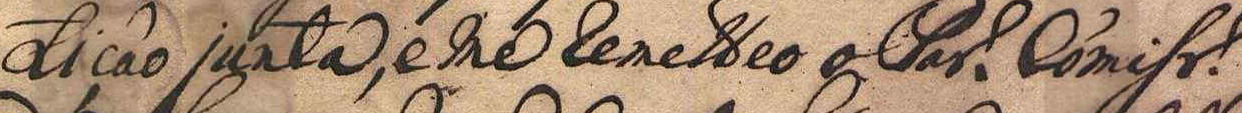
tiçaõ junta, e me Remetteo o Par.o Com̄isr.o
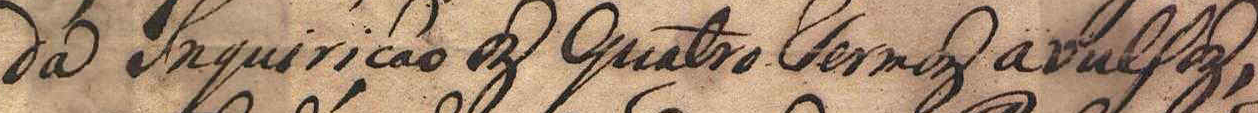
da Inquirição oz Quatro Termoz avulsoz,
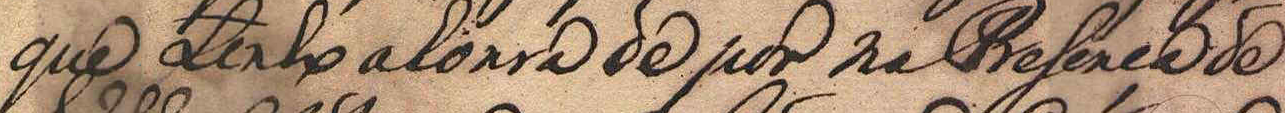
que tenho a honra de por na Presença de
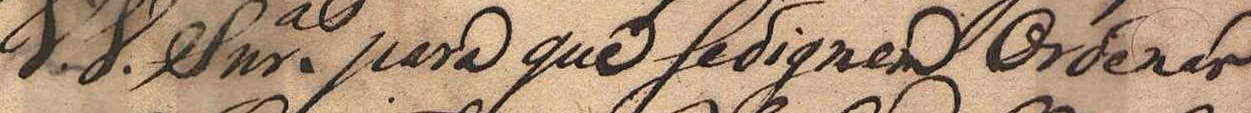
V.V. Snr.as para que se dignem Ordenar
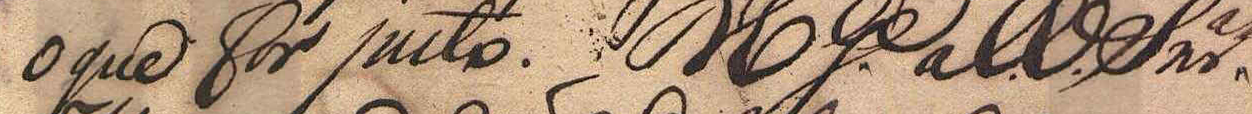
o que for justo. Ds G.e a V.V. Snr.as
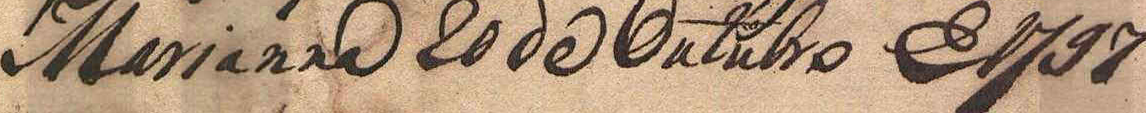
Marianna 20 de Outubro E 1797
